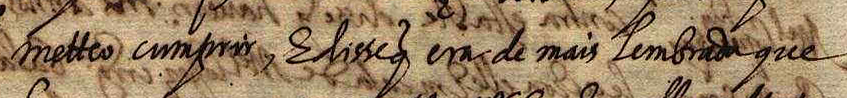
metteo cumprir, E disse q̄ era de mais lembrada que
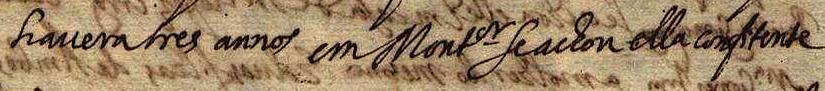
hauera tres annos em Mont.or se achou ella confitente
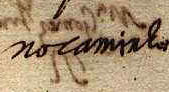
no caminho
